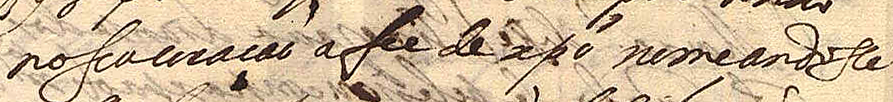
no seu coraçaõ a fee de xpō nomeandosse
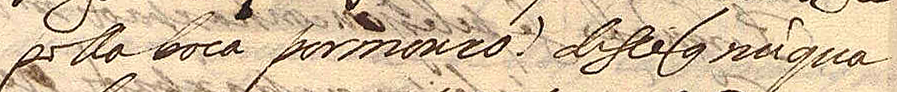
polla boca por mouro? disse q̄ nūqua
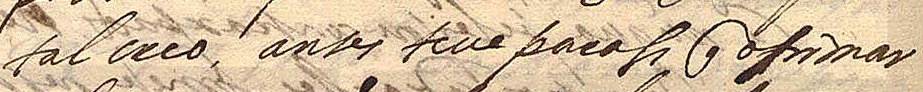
tal creo, antes teue para si q̄ affirmar
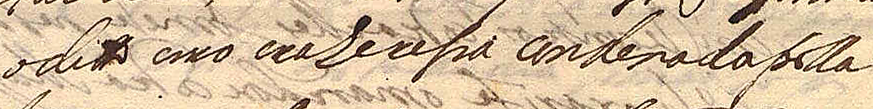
o ditto erro era heresia condenada polla
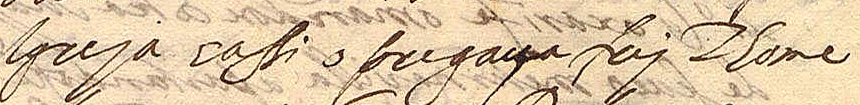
Igreja E assi o pregaua frej Thome
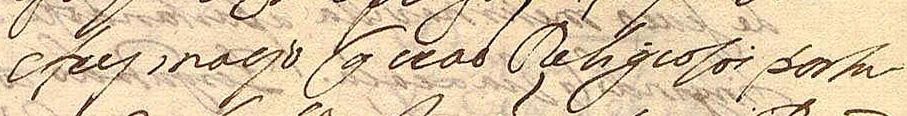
e frej inacjo q̄ eraõ Religiosos portu
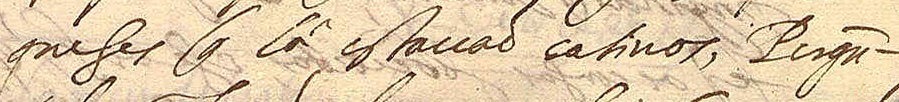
gueses q̄ lá estauaõ catiuos, Pergū
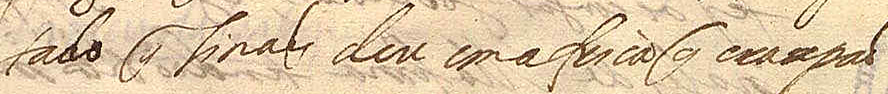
tado q̄ sinais deu em africa q̄ era xpaõ
